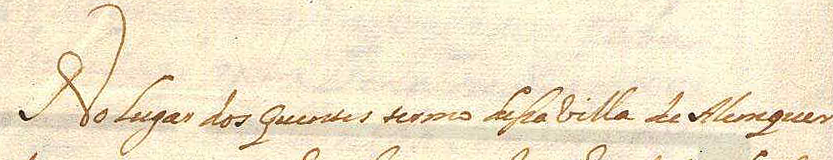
No lugar dos quentes termo desta Villa de Alemquer
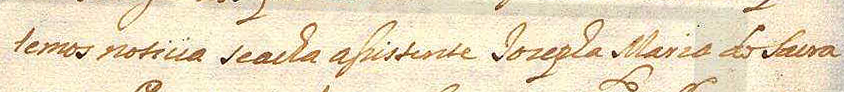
temos noticia se acha assistente Iozepha Maria do Sacra
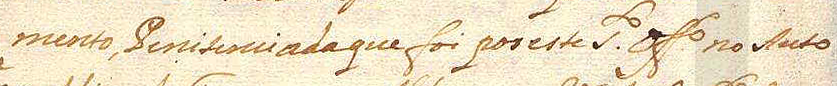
mento, Penitenciada que foi por este s.to Off.o no Auto
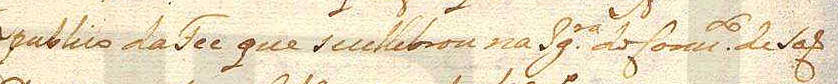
publico da Fee que se cellebrou na Ig.ra do Conu.to de Saõ
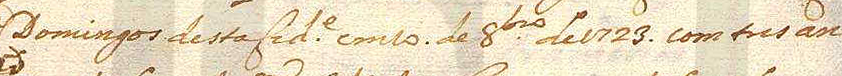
Domingos desta Cid.e em 10. de 8.bro de 1723. com tres an
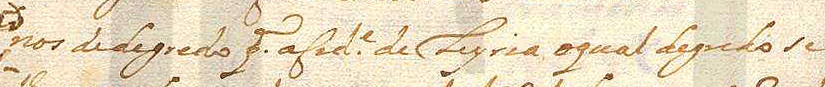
nos de degredo p.a a Cid.e de Leyria o qual degredo se
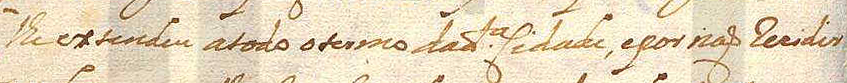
lhe extendeu a todo o termo da d̄.a Cidade, e por naõ Rezidir
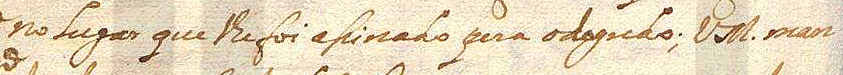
no lugar que lhe foi assinado pera o degredo; V M. man
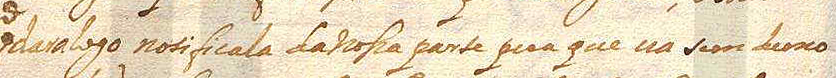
dara logo notificada da nossa parte pera que ua sem demo
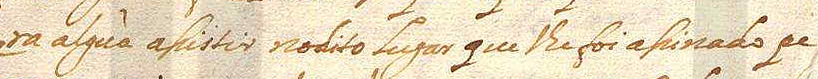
ra alguā assistir no dito lugar que lhe foi assinado pe
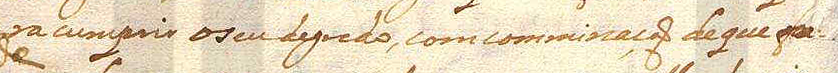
ra cumprir o seu degredo, com comminaçaõ de que fa
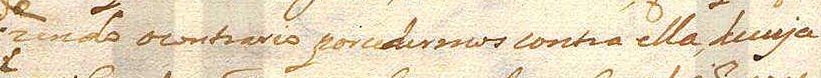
zendo o contrario porcedermos contra ella, de cuja
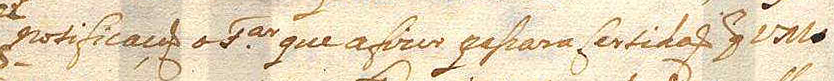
notificaçaõ o F.ar que a fizer passara Certidaõ q̄ V M
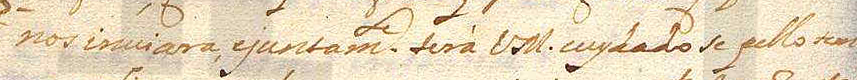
nos inuiara, e juntam.te terá VM. cuydado se pello tem
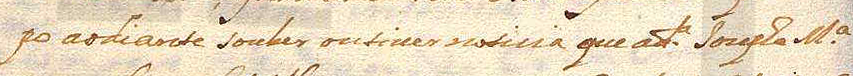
po ao diante souber ou tiuer noticia que a d̄.a Iozepha M.a
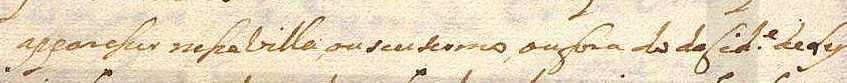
apparesser nessa Villa, ou seu termo, ou fora do da Cid.e de Ley
